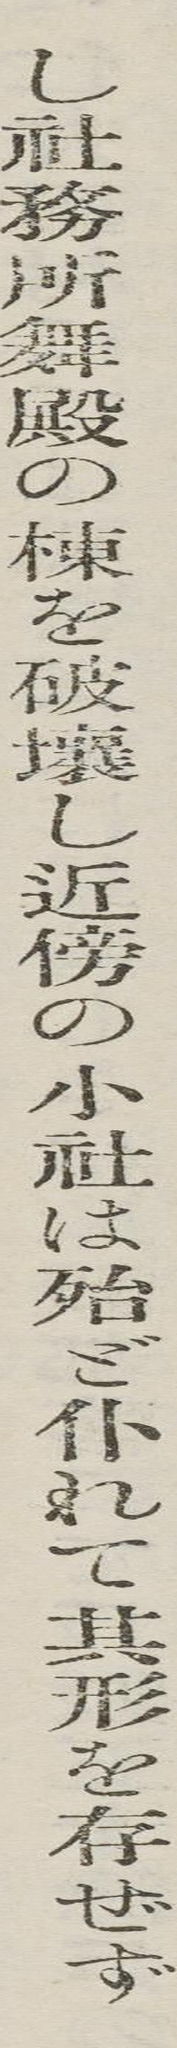し社務所舞殿の棟を破壊し近傍の小社は殆ど仆れて其形を存ぜず
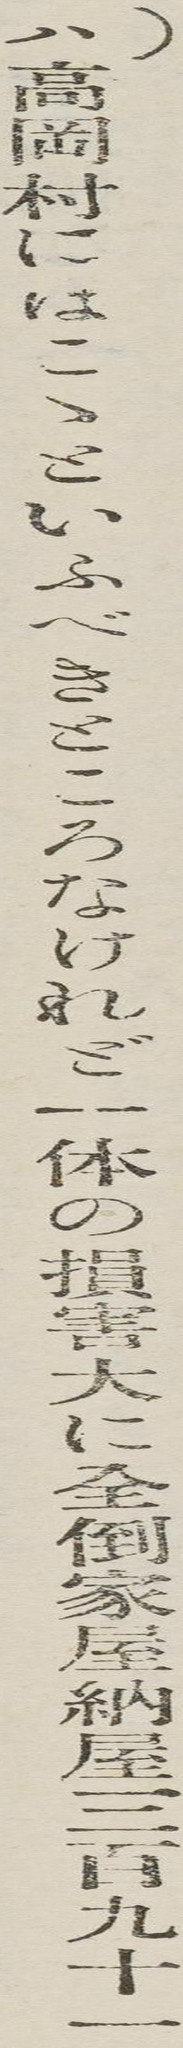高岡村にはこゝといふべきところなけれど一体の損害大に全倒家屋納屋三百九十一
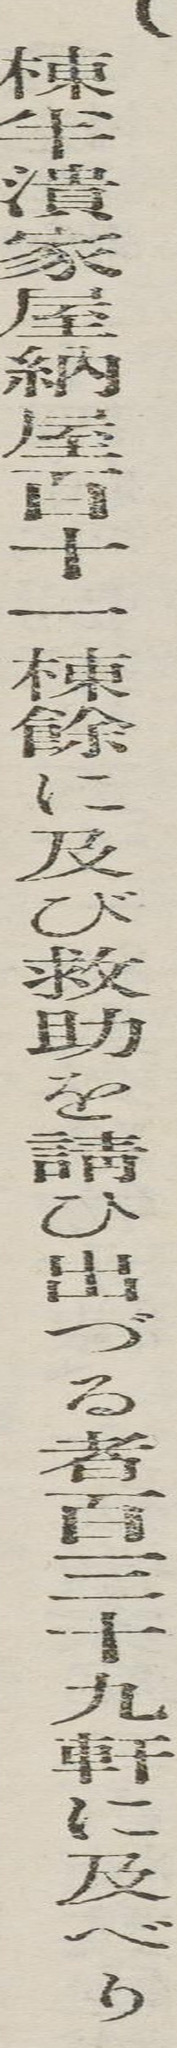棟半潰家屋納屋百十一棟余に及び救助を請ひ出づる者百三十九軒に及べり
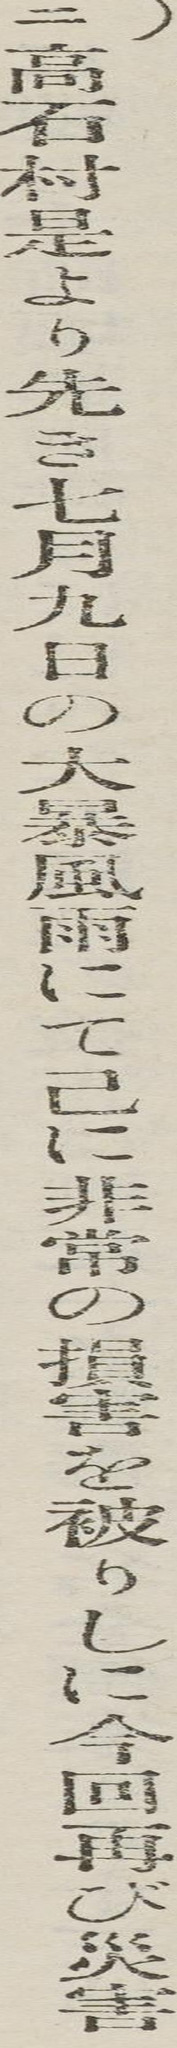高石村是より先き七月九日の大暴風雨にて己に非常の損害を被りしに今回再び災害
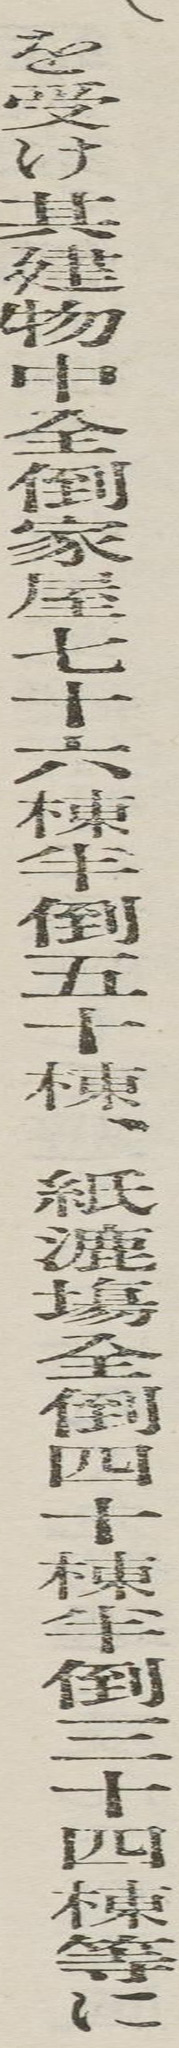を受け其建物中全倒家屋七十六棟半倒五十棟、紙漉場全倒四十棟半倒三十四棟等に
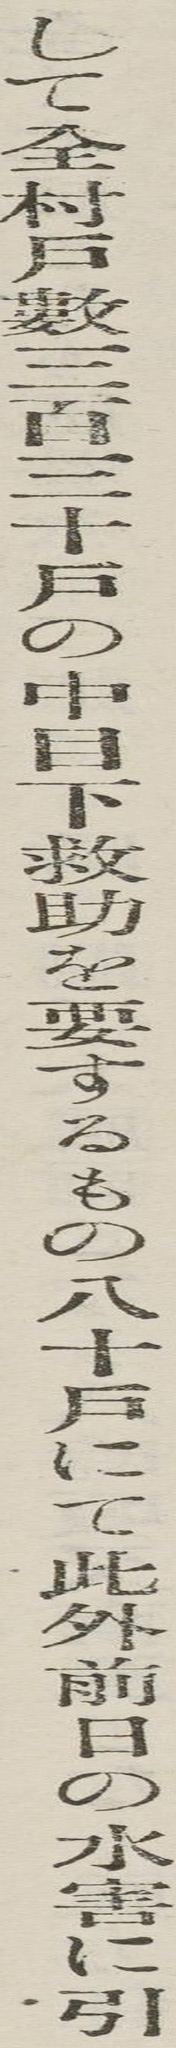して全村戸数三百三十戸の中目下救助を要するもの八十戸にて此外前日の水害に引
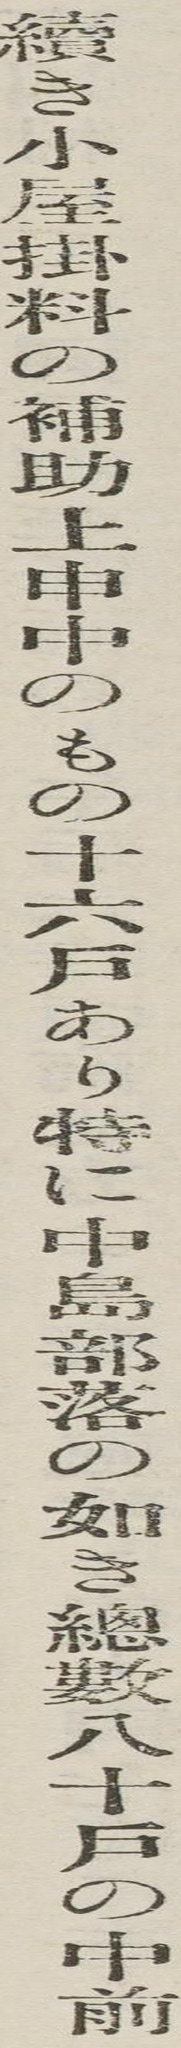続き小屋掛料の補助上申中のもの十六戸あり特に中島部落の如き総数八十戸の中前
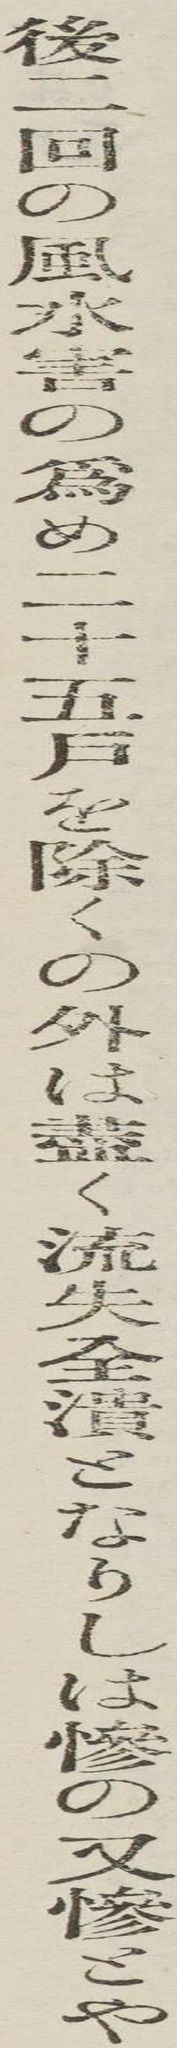後二回の風水害の為め二十五戸を除くの外は尽く流失全潰となりしは惨の又惨とや

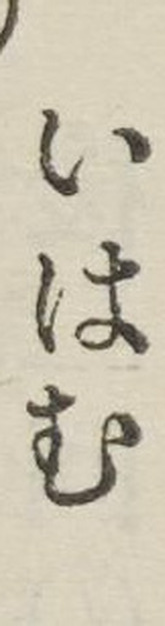いはむ
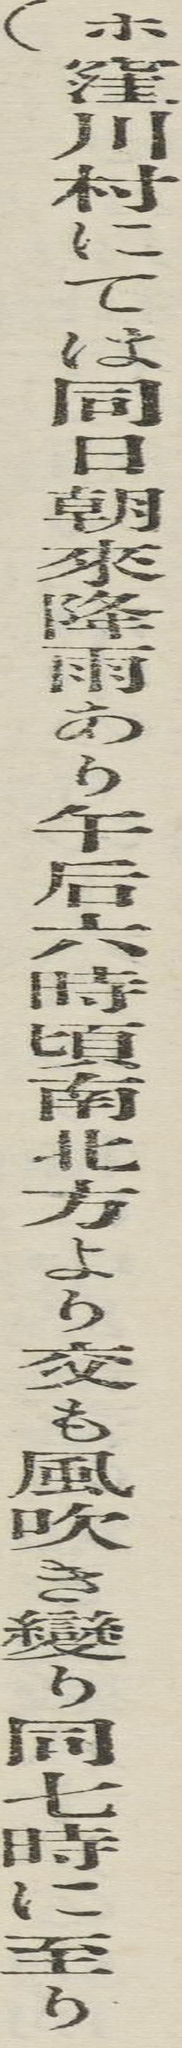窪川村にては同日朝来降雨あり午后六時頃南北方より交も風吹き変り同七時に至り
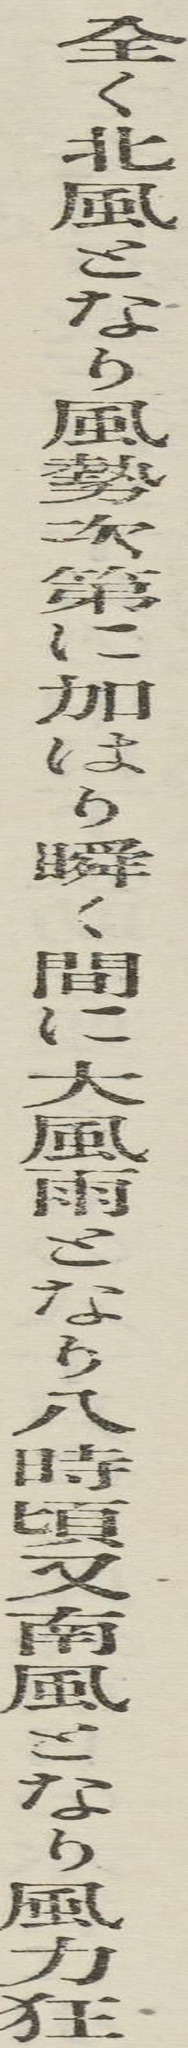全く北風となり風勢次第に加はり瞬く間に大風雨となり八時頃又南風となり風力狂
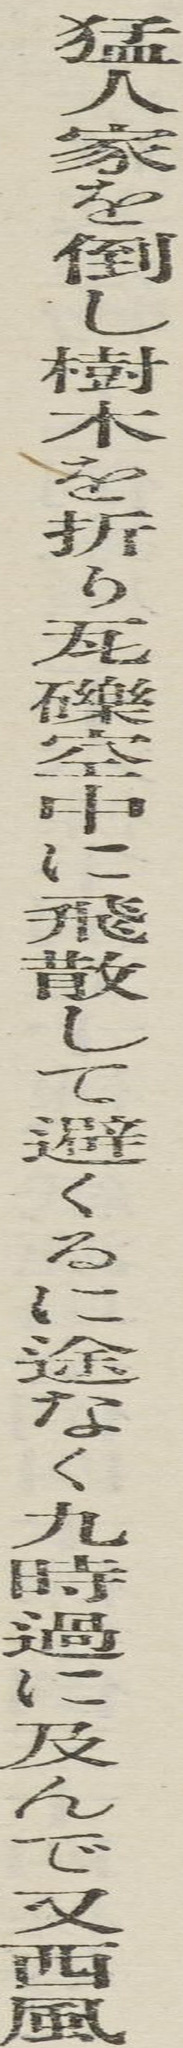猛人家を倒し樹木を折り瓦礫空中に飛散して避くるに途なく九時過に及んで又西風
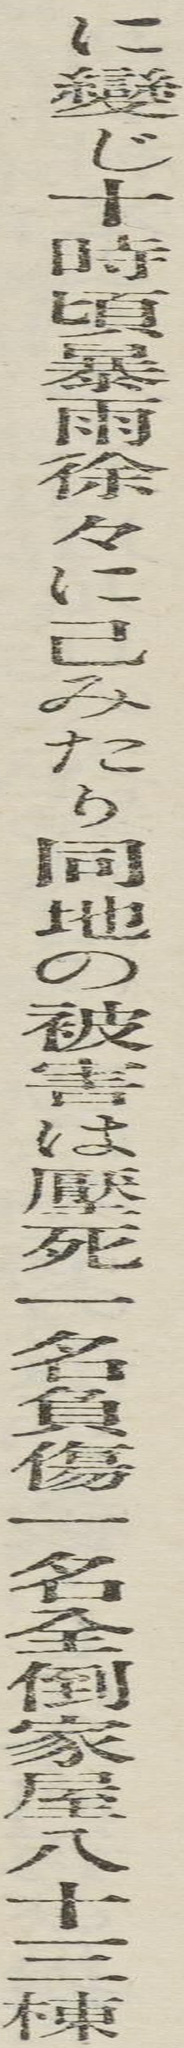に変じ十時頃暴雨徐々に己みたり同地の被害は圧死一名負傷一名全倒家屋八十三棟
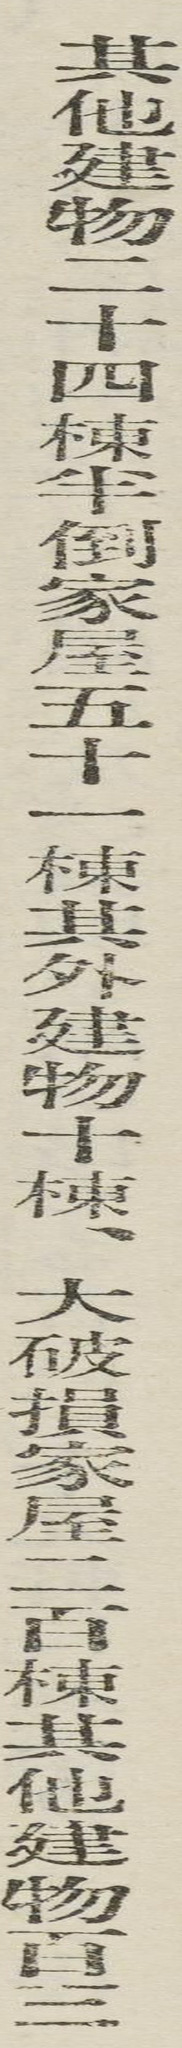其他建物二十四棟半倒家屋五十一棟其外建物十棟、大破損家屋二百棟其他建物百三
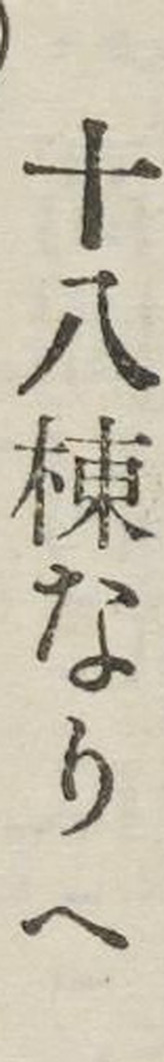十八棟なりへ
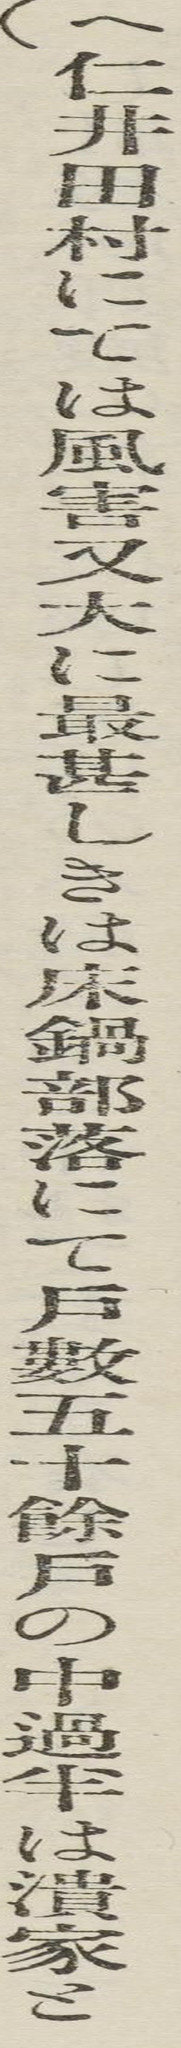仁井田村にては風害又大に最甚しきは床鍋部落にて戸数五十余戸の中過半は潰家と
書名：土佐古今ノ地震
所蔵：東京大学地震研究所図書室 Earthquake Research Institute Library, The University of Tokyo, JAPAN
